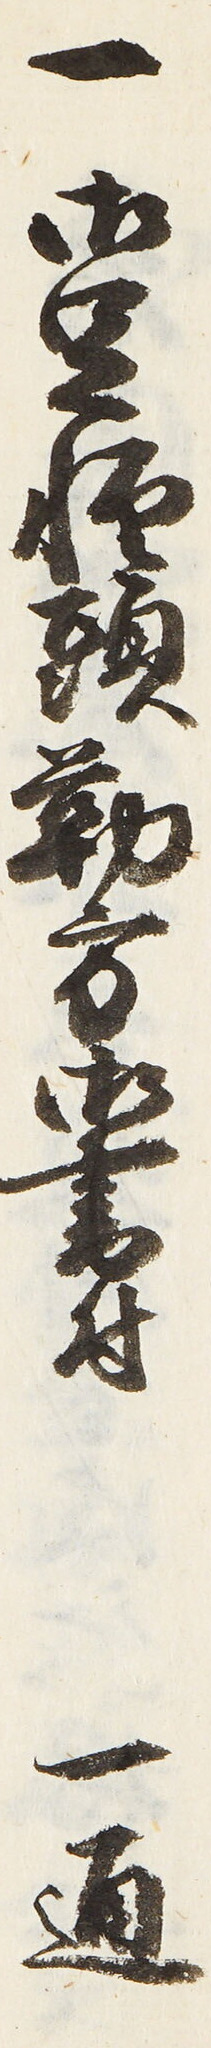一御足軽頭勤方御書付一通
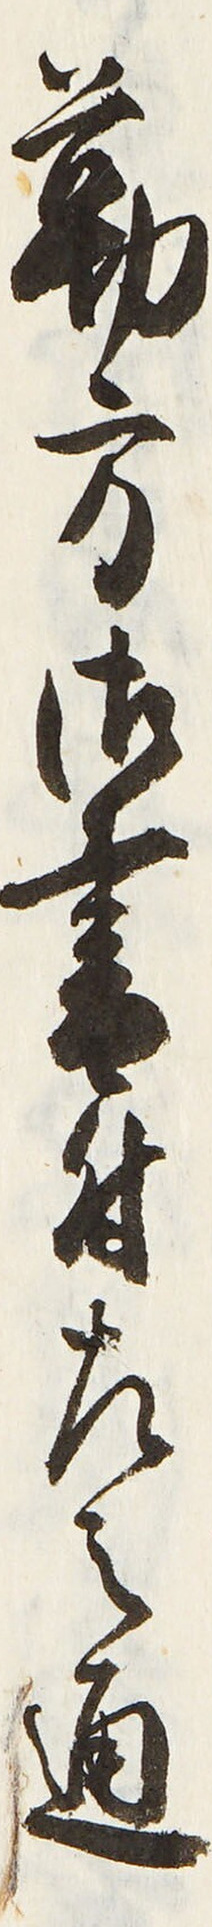勤方御書付左之通
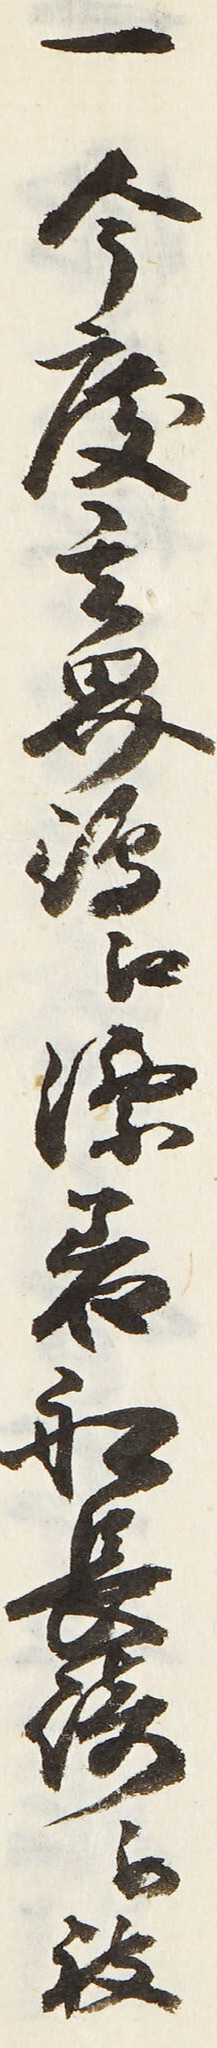一今度玄界島江漂着船長崎江被
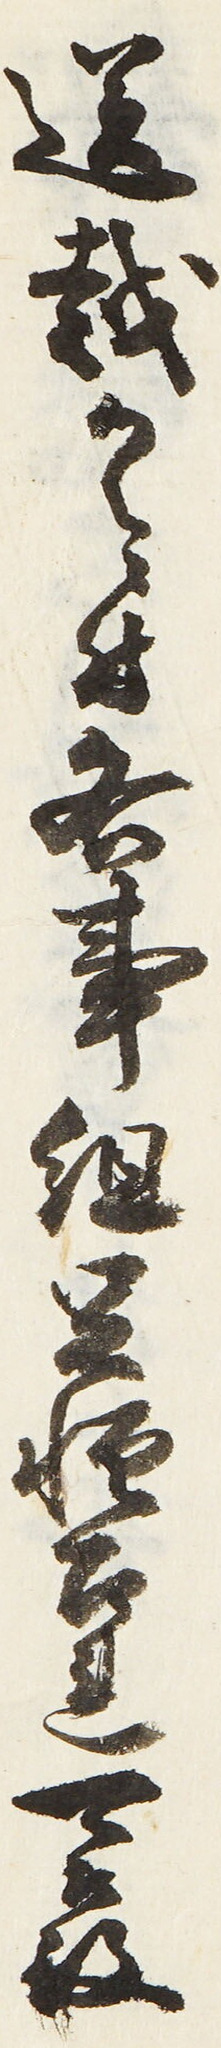送越候ニ付各事組足軽召連可被致
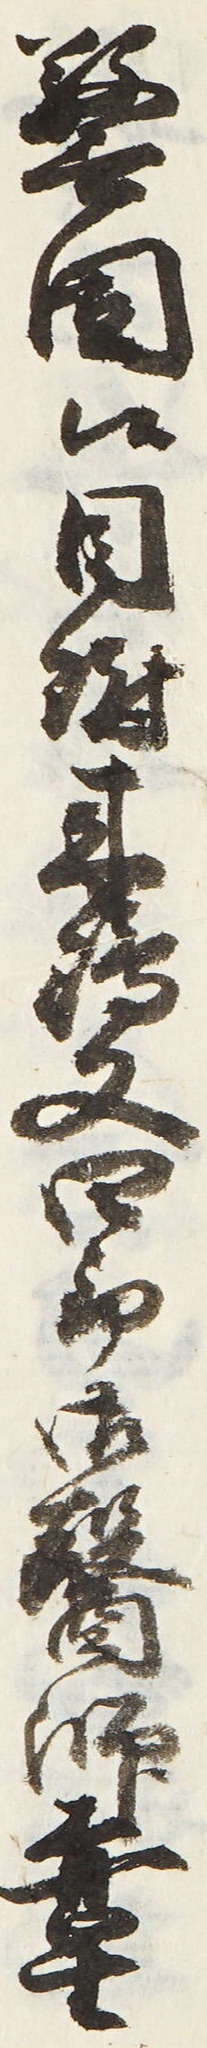警固候目付来嶋又四郎御医師赤星
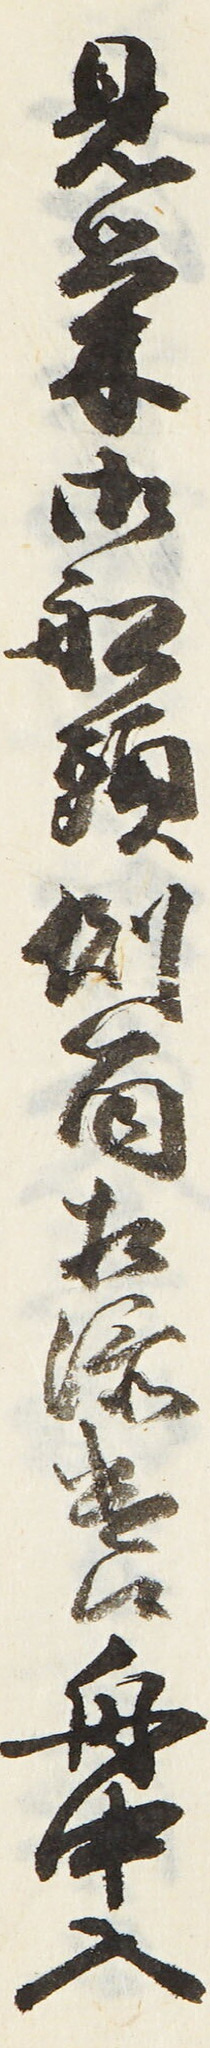見栄御船頭側筒相添遣候舟中入
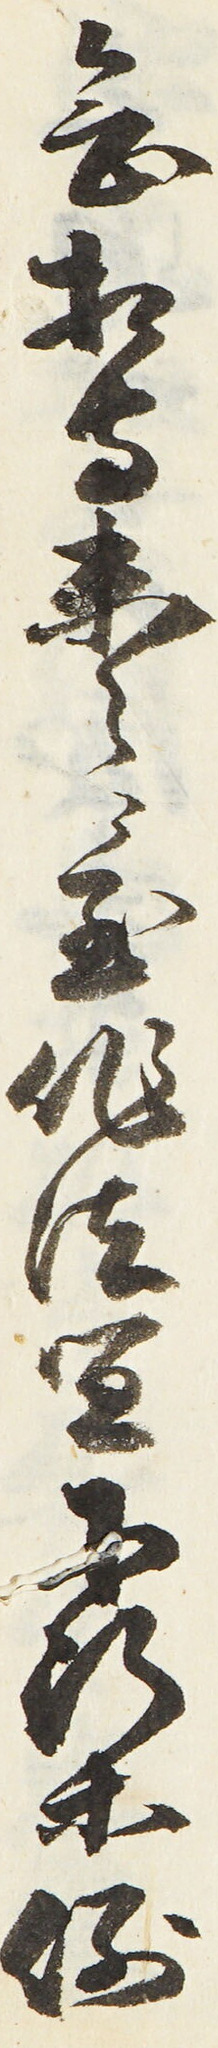念相守末々ニ至作法宜下行等例

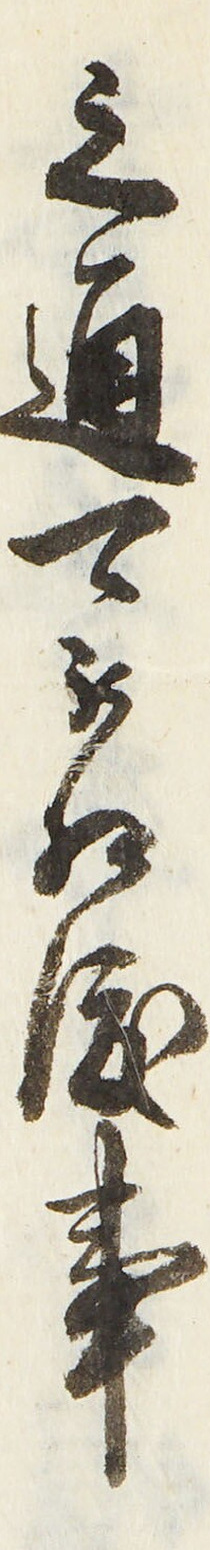之通可被相渡事
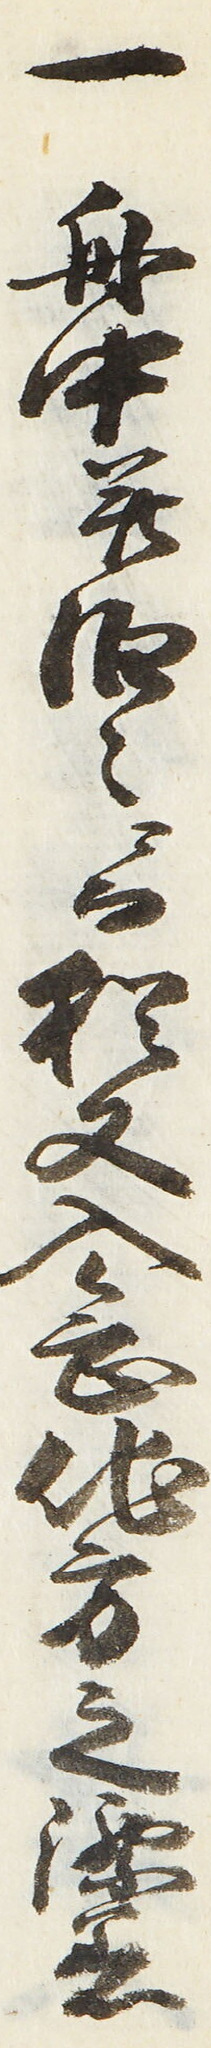一舟中并泊々ニ而猶又入念他方之漂着
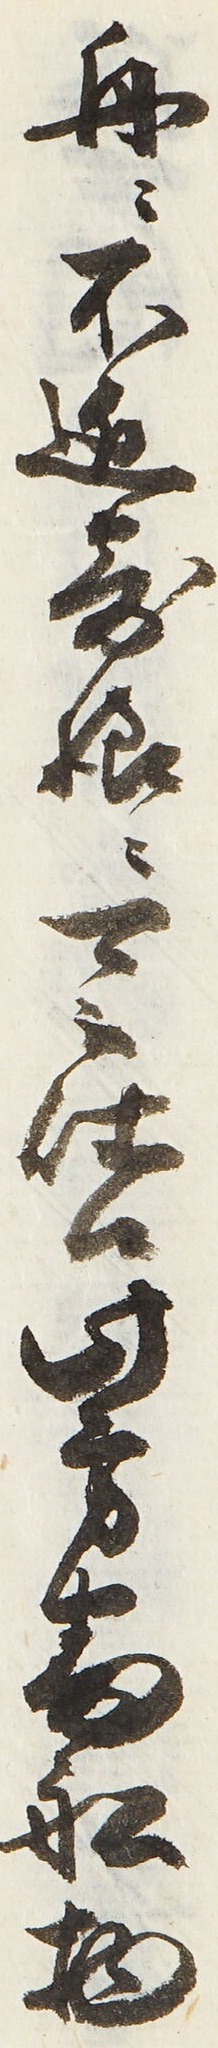舟ニ不近寄様ニ可被仕候此方番船物
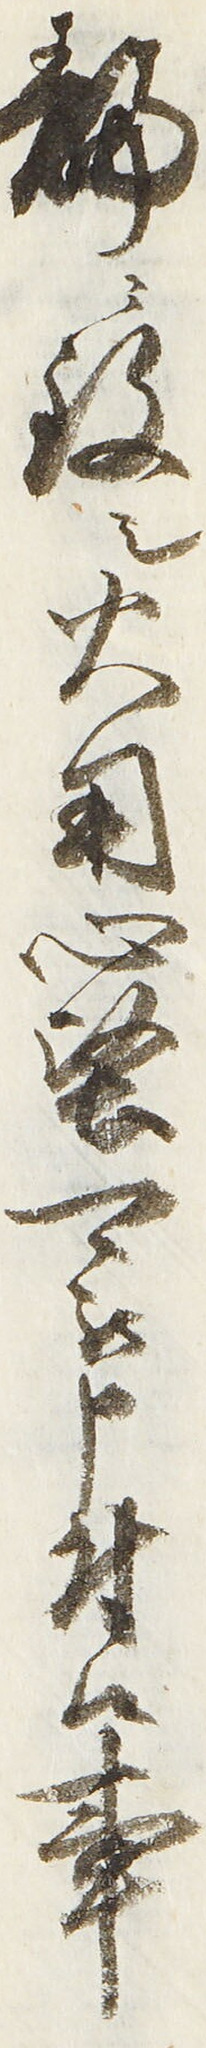静ニ致シ火用心堅可被申付候事
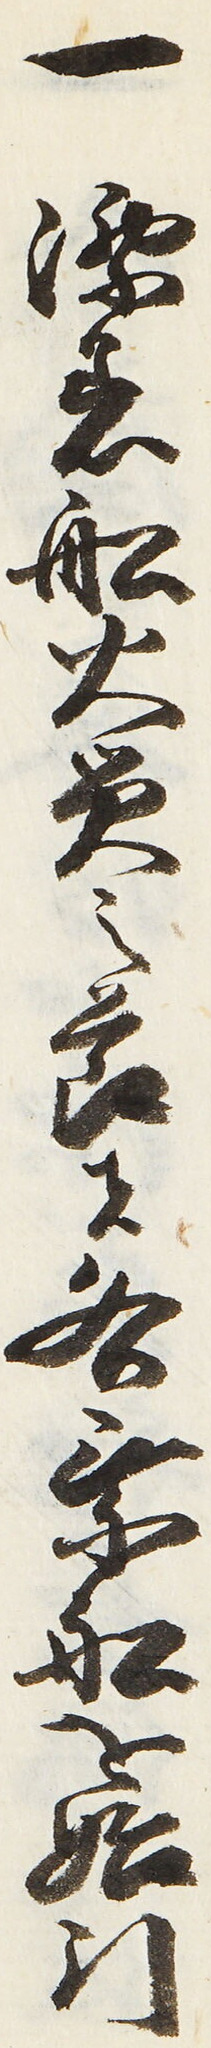一漂着船火災之節者各乗船を始引
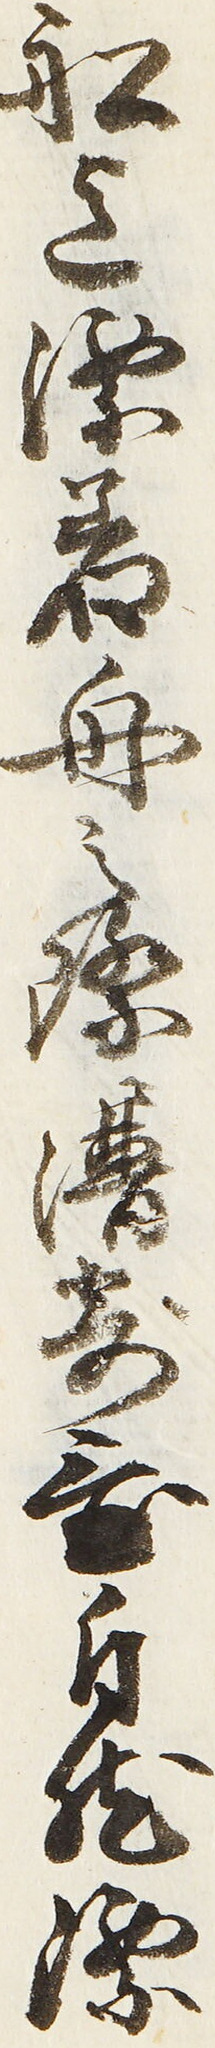船迄漂着舟之際ニ漕寄置自然漂
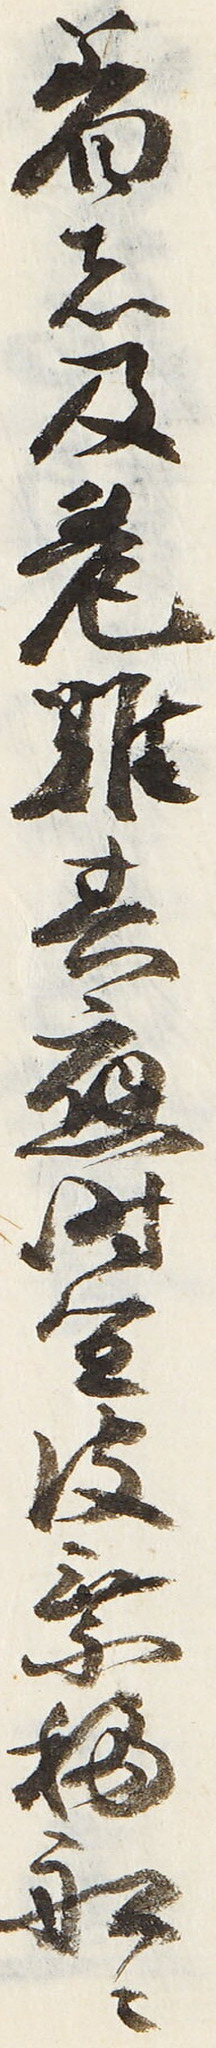着者及危難其応時宜役乗移船ニ
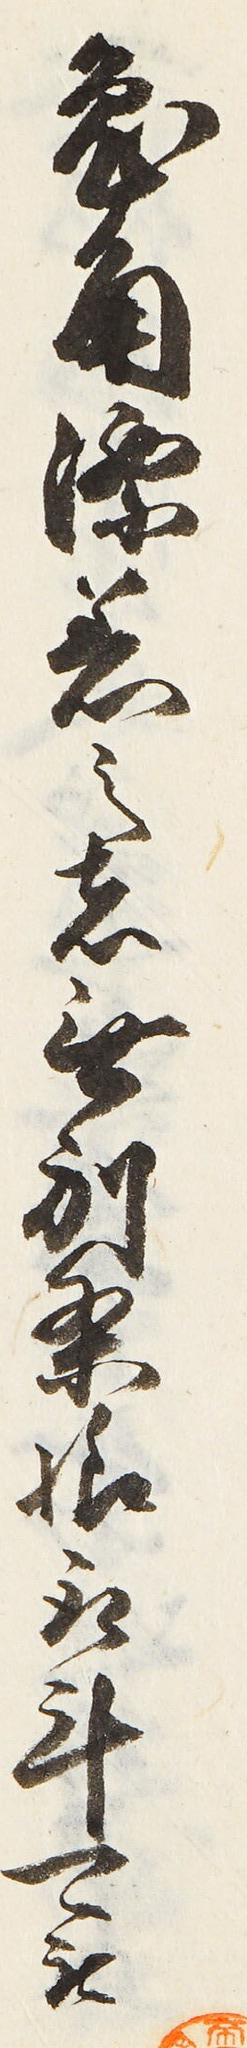兎角漂着之者無別条様取計可被
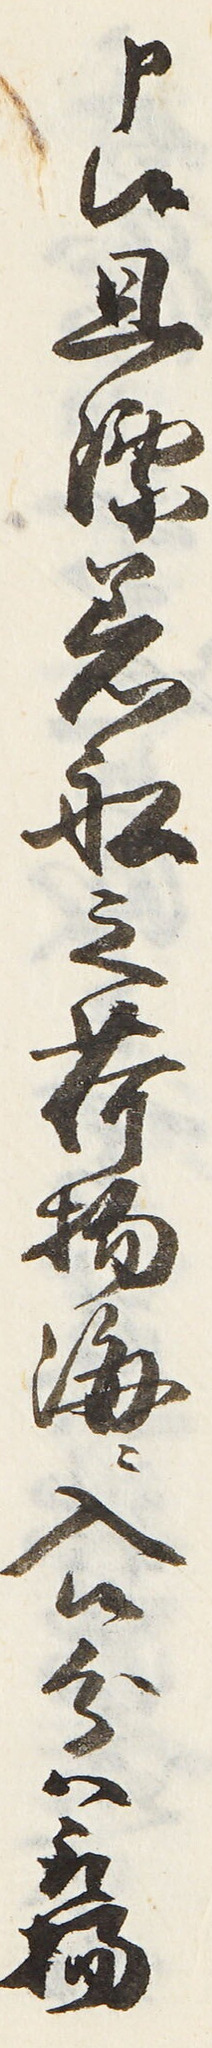申候且漂着船之荷物海ニ入候分ハ取揚
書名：玄海嶋江漂着船為警固長崎江被越候覚
